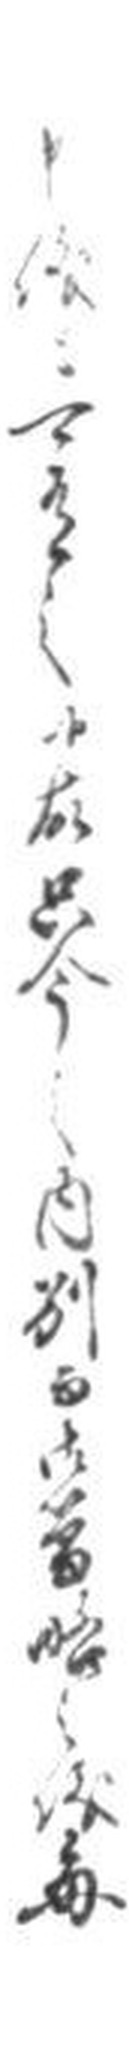申儀ニ可有之候故只今之内別而御簡略之儀毎
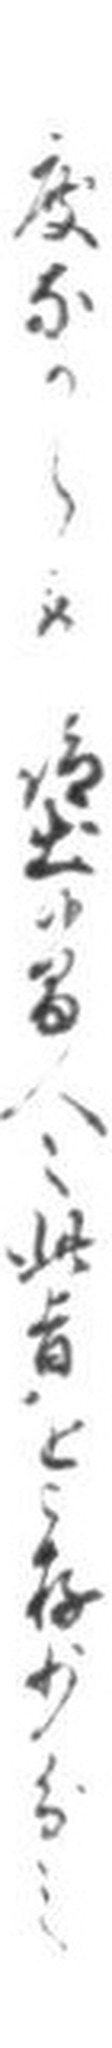度なから被仰出候間人々此旨を被存少分之
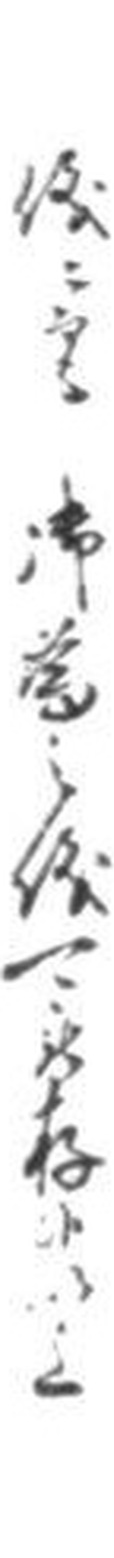儀ニ而は御為之儀可被存候以上
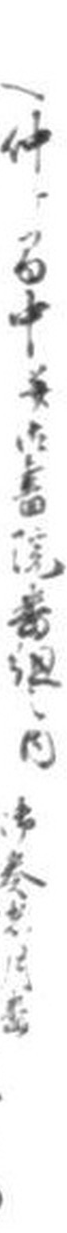仲ケ間中幷御書院番組之内御奏者月番
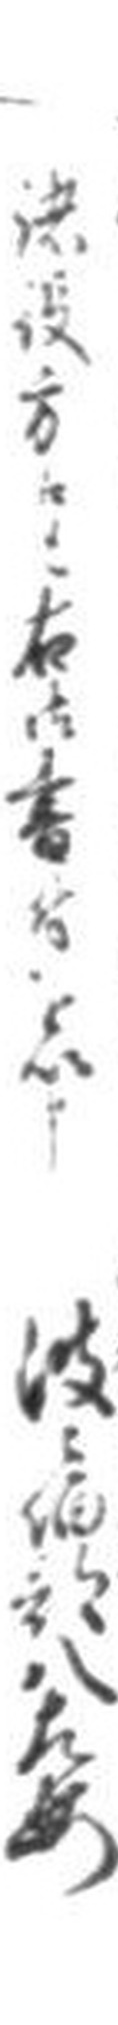諸役方江も右御書付を以申波々伯部八左衛門
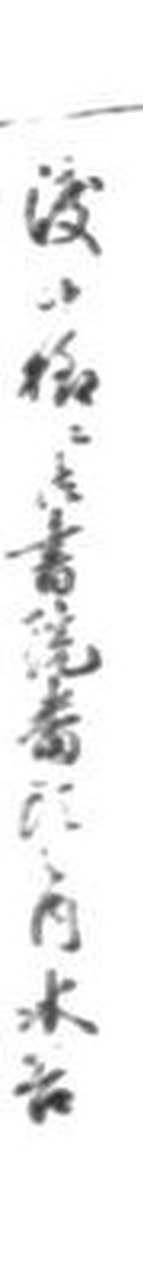渡候様ニ御書院番頭之内水谷
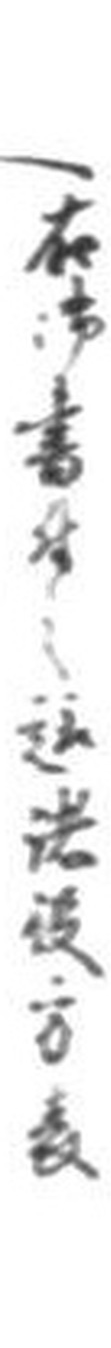右御書付之趣諸役方表
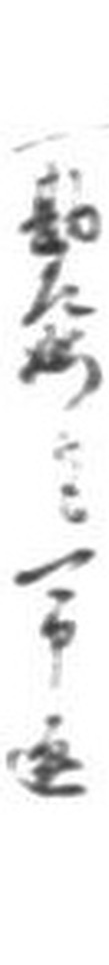勘左衛門江も可申通
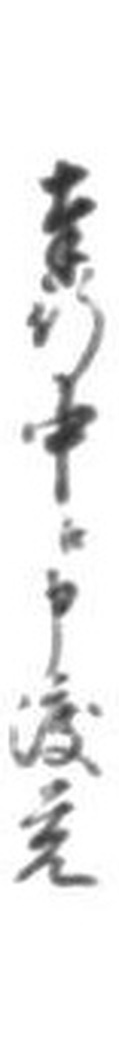奉行中江申渡覚
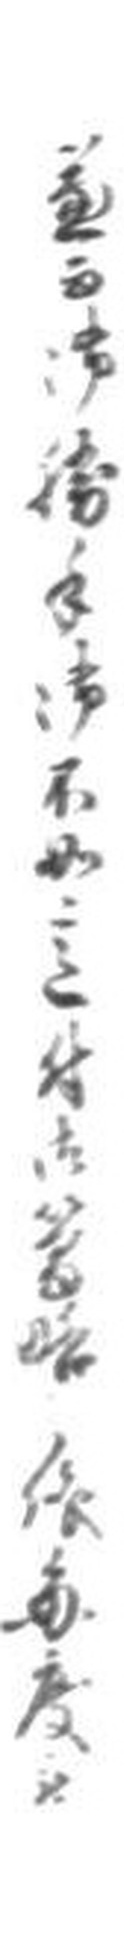兼而御勝手御不如意付御簡略儀毎度被
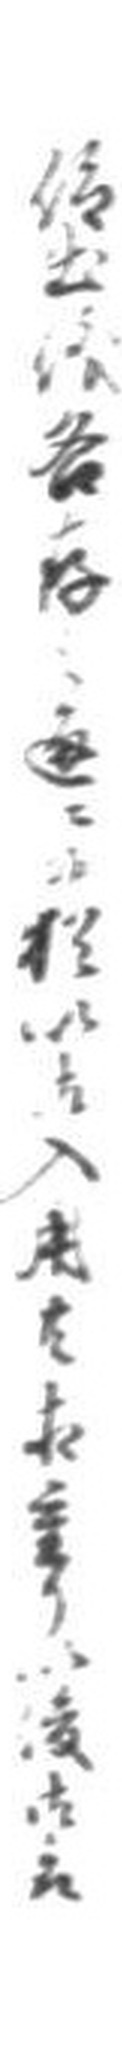仰出儀各存之通ニ候猶以御入用共相重り以後御取
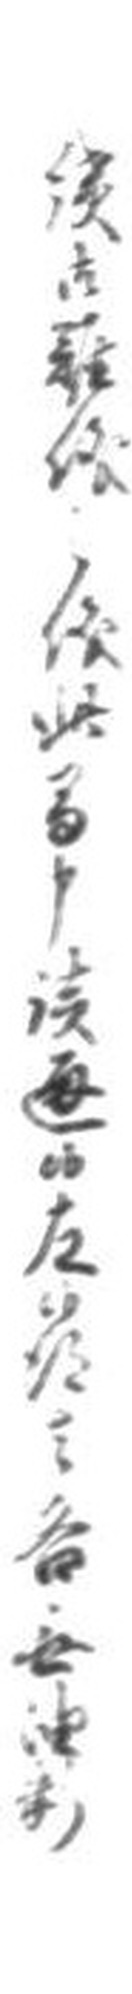続御難儀之儀此間申談通候左候得者各無油断
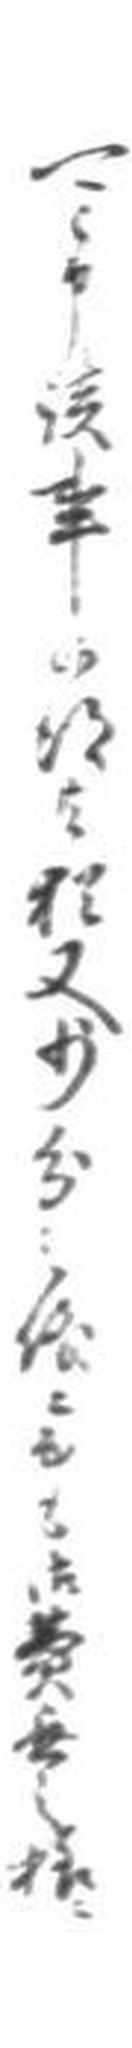可被申談事候得共猶又少分之儀ニ而も御費無之様ニ

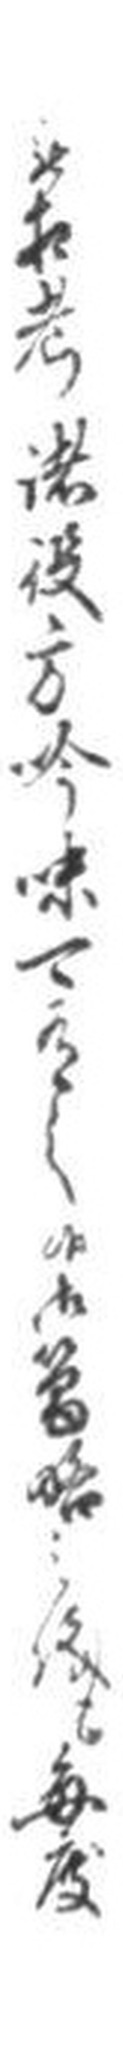被相考諸役方吟味可有之候御簡略之儀も毎度
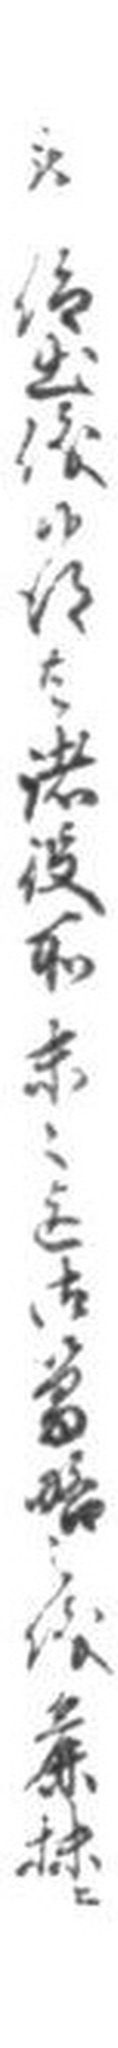被仰出儀候得共諸役所末々迄御簡略之儀麁抹ニ
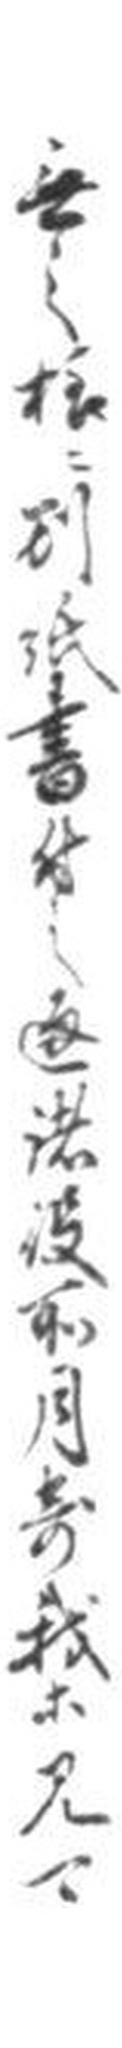無之様ニ別紙書付之通諸役所月寄我等見可
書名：家譜 三十九 宗矩公 享保十年
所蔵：福井県文書館 Fukui Prefectural Archives
